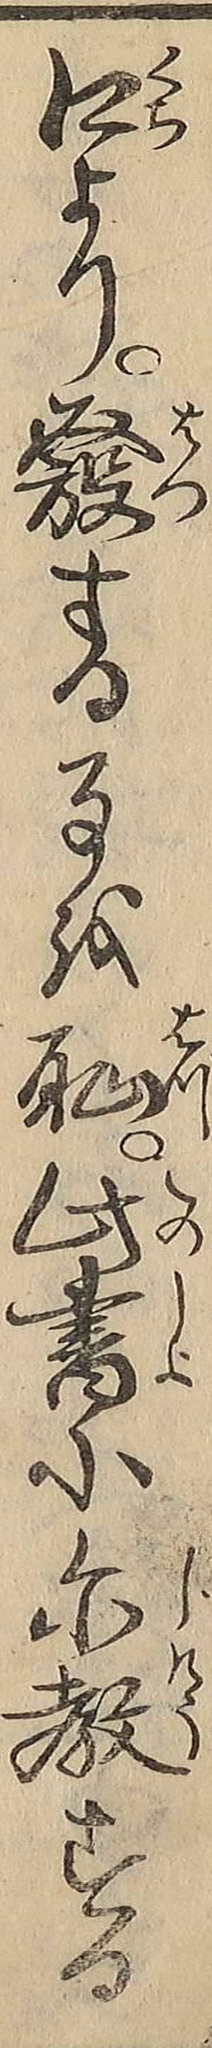口より。発する事を恥。此書に示教する
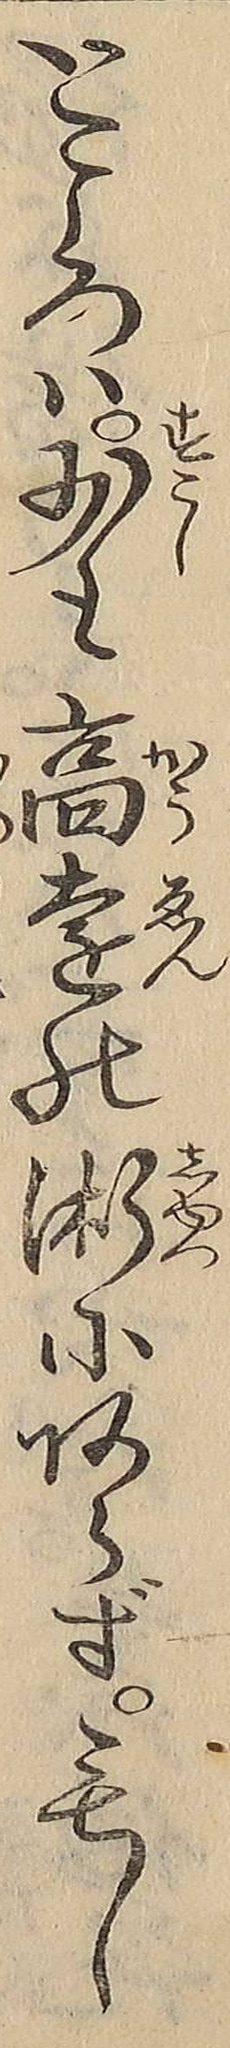ところは。少も高遠の術にあらず。もし
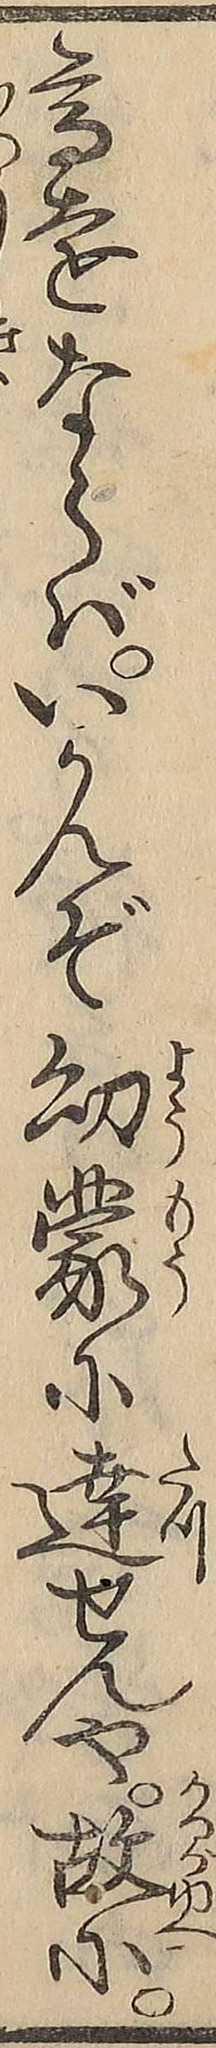高遠ならば。いかんぞ幼蒙に達せんや。故に。
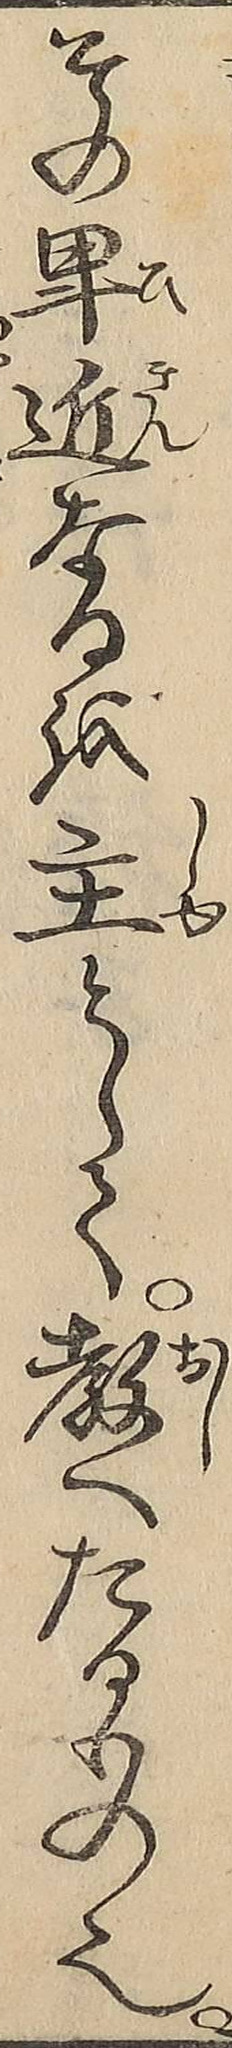その卑近なるを主として。教へたるもの也。
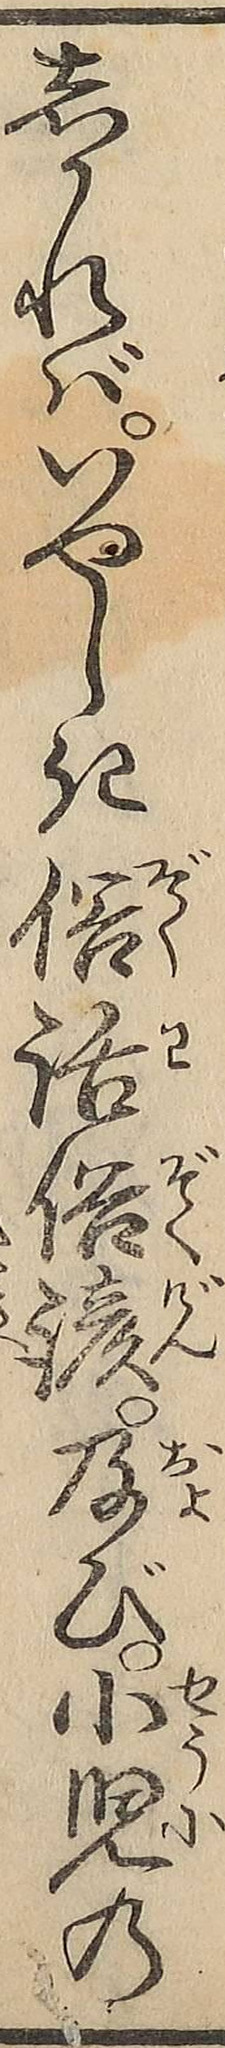しかれば。いやしき俗話俗諺。及び。小児の
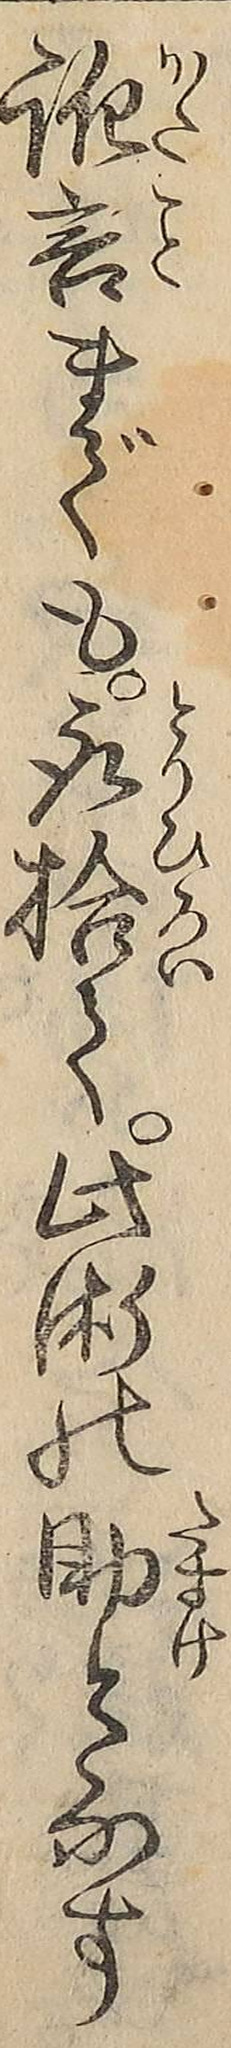訛言までも。取拾て。此術の助となす
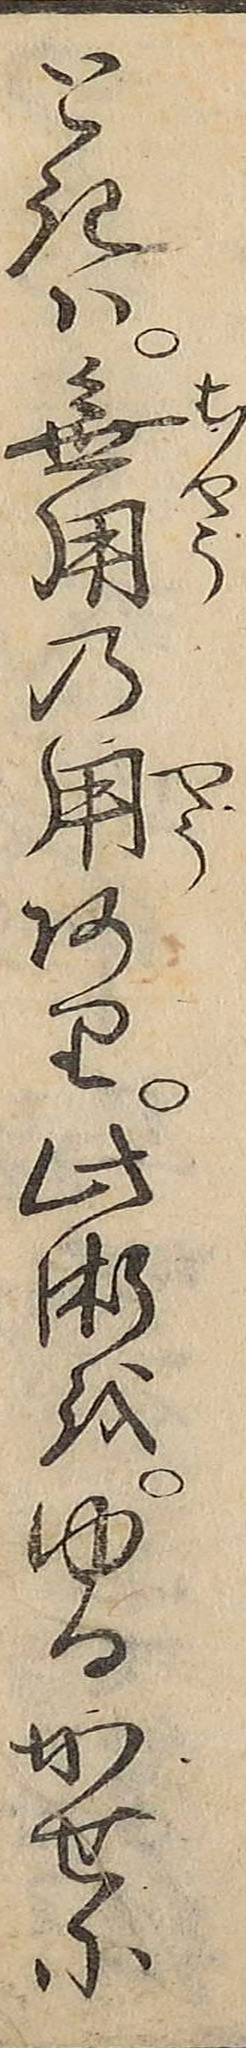ときは。無用の用あり。此術を。ゆるかせに
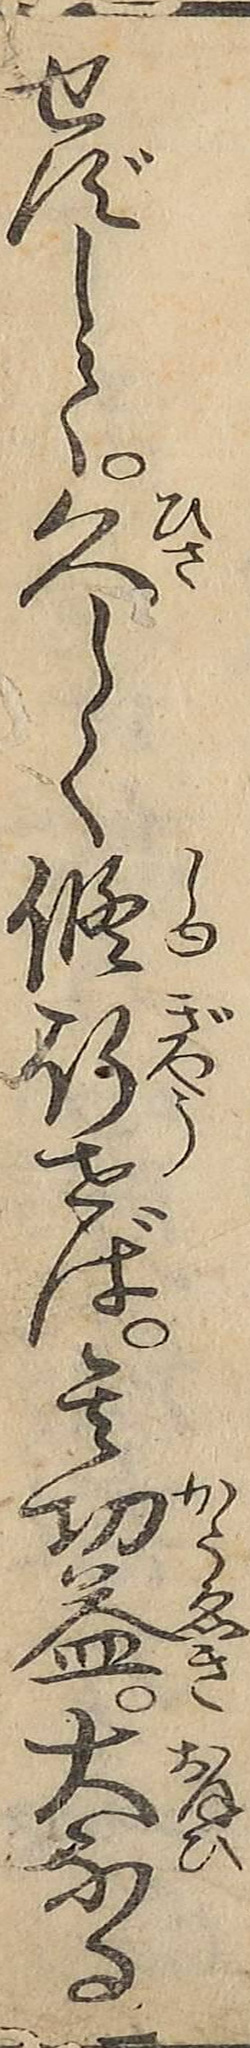せずして。久しく修行せば。其功益。大なる

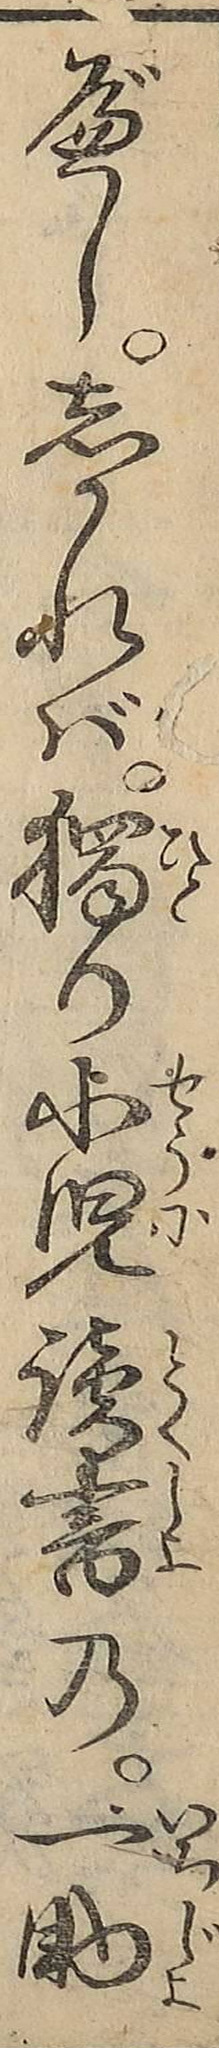べし。しかれば。独り小児読書の。一助
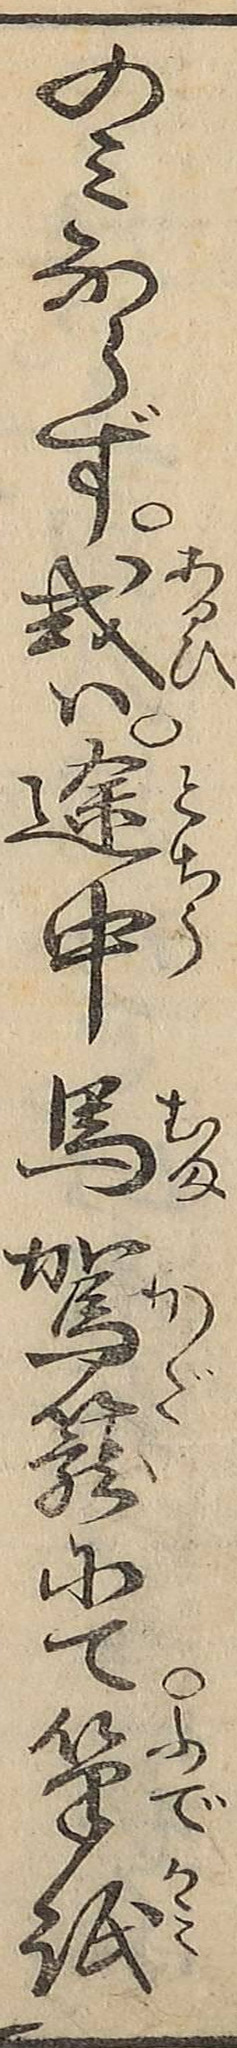のみならず。或は。途中馬駕籠にて。筆紙
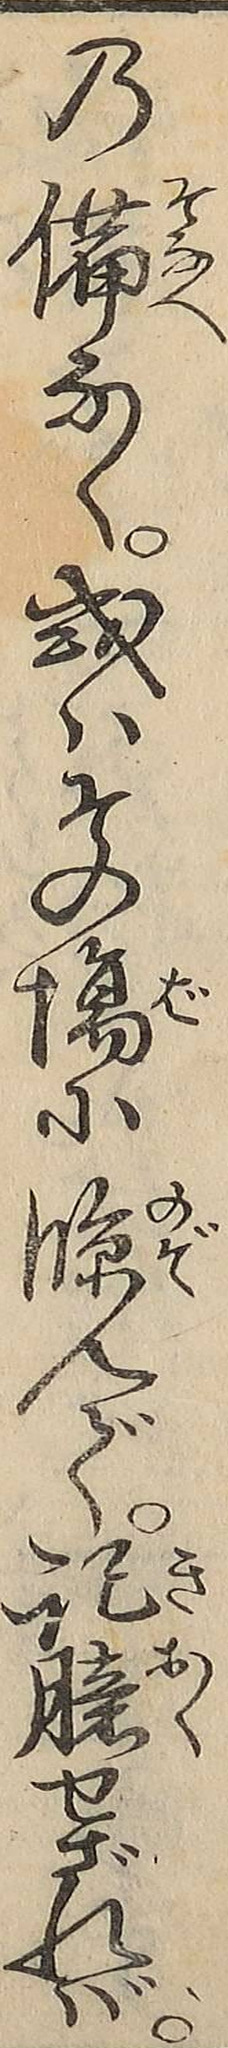の備なく。或はその場に臨んで。記臆せざれば。
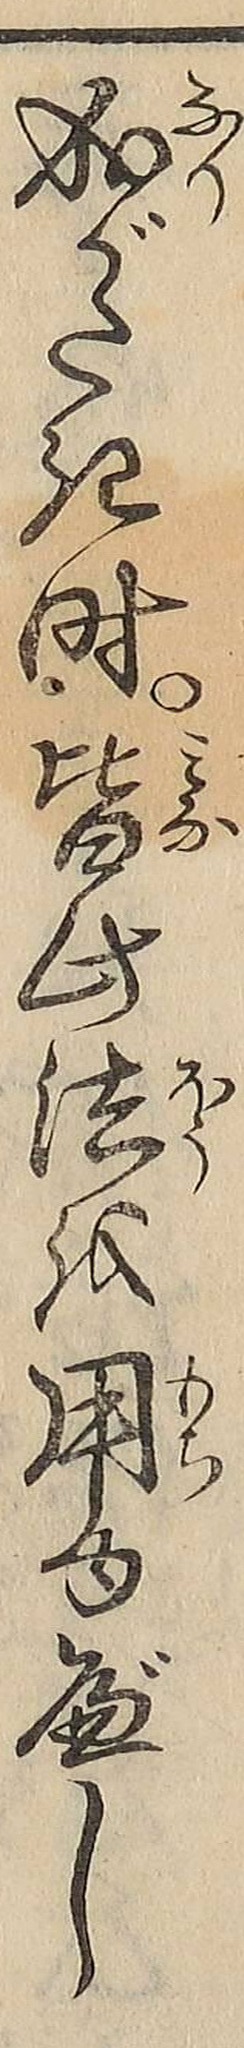成がたき時。皆此法を用ゆべし
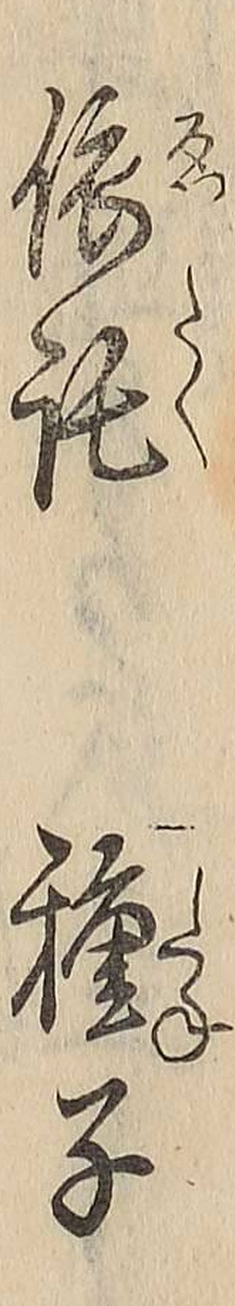依託種子
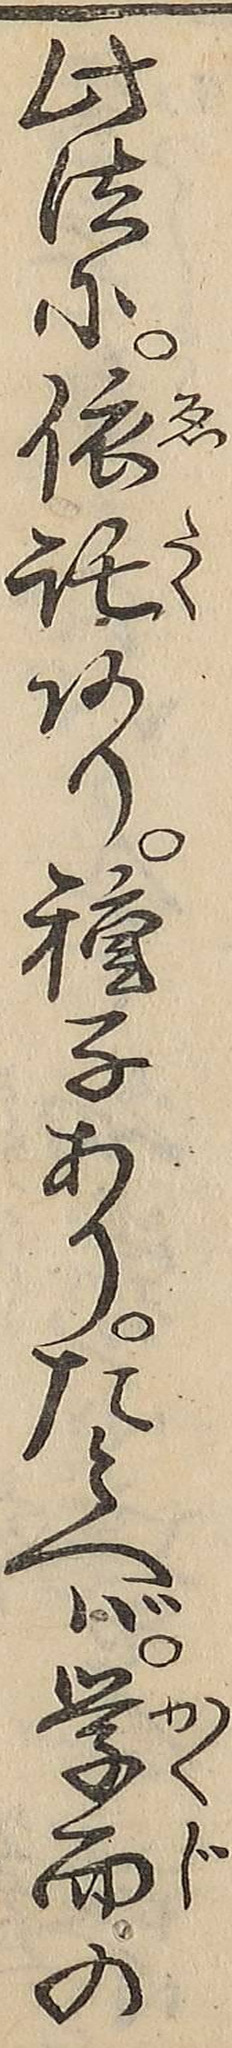此法に。依託あり。種子あり。たとへば。学而の
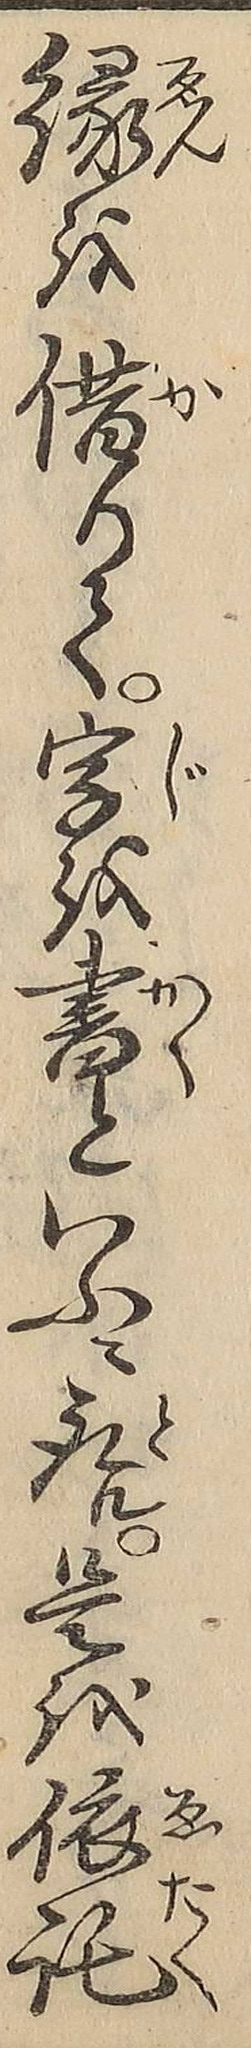縁を借りて。字を書といふに取る。是を依託
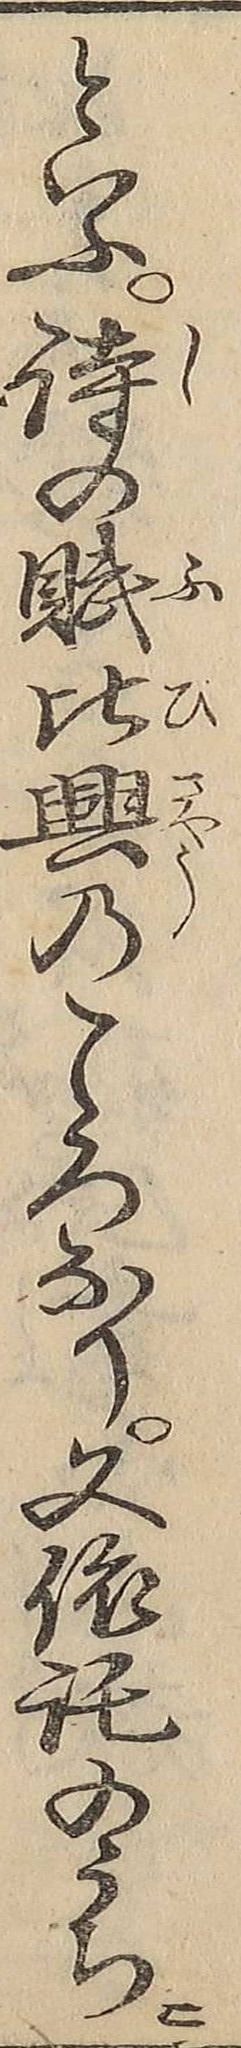といふ。詩の賦比興のこゝろなり。又依託のうちに
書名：物覺秘傳
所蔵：神戸大学附属図書館 国文学研究資料館
